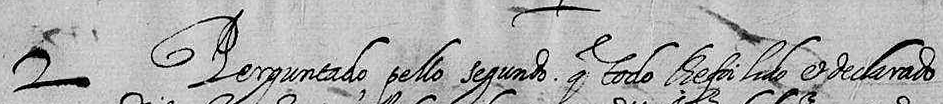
2 Perguntado, pello segundo. q̄ todo lhe foi lido & declarado
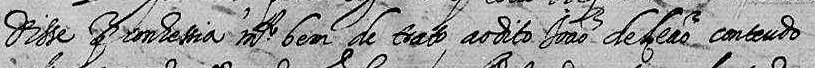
disse q̄ conhessia mto. bem de trato ao dito Ioaõ de Leaõ conteudo
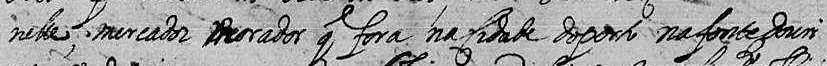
nelle mercador morador q̄ fora na Cidade do porto na fonte douri
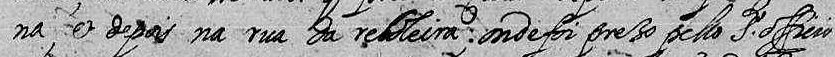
na, & depois na rua da reboleira: onde foi prezo pello s.to officio
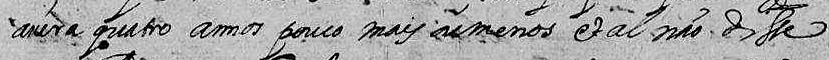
auera quatro annos pouco mais ou menos & al naõ disse
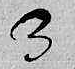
3
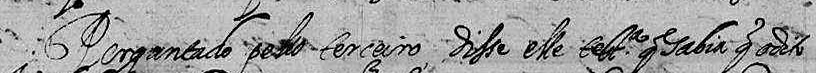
Perguntado pello terceiro disse elle test.a q̄ sabia q̄ o dito
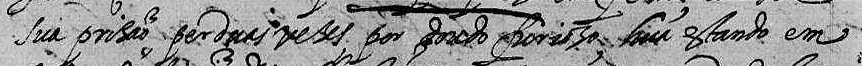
sua prisaõ por duas vezes por doudo furioso, huā estando em
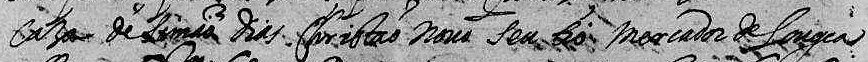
caza de Simaõ dias Christaõ nouo seu tio mercador de Lougea
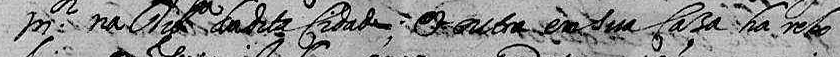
mor. na Ribra da dita Cidade; & outra em sua Caza ha rebo
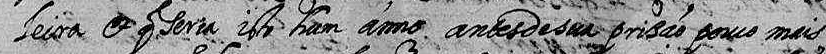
leira & q̄ seria isto hum anno antes de sua prisaõ pouco mais
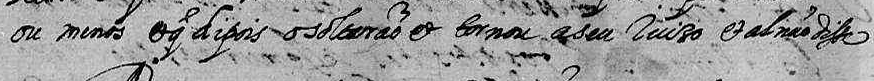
ou menos & q̄ dipois o soltaraõ & tornou a seu Iuizo & al não disse
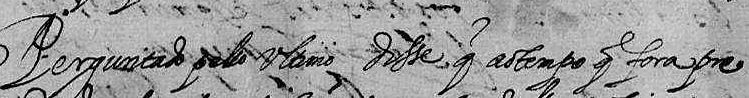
Perguntado pello vltimo disse q̄ ao tempo q̄ fora pre
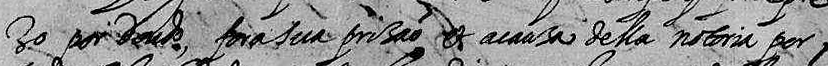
zo por doudo, fora sua prizaõ & a cauza della notoria por
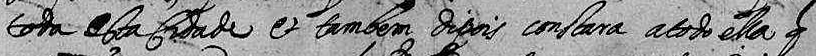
toda esta Cidade & tambem dipois constara a todo ella q̄
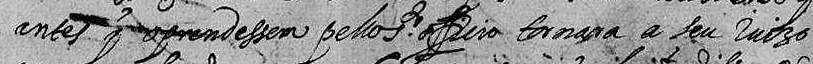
antes q̄ o prendessem pello s.to officio tornara a seu iuizo
